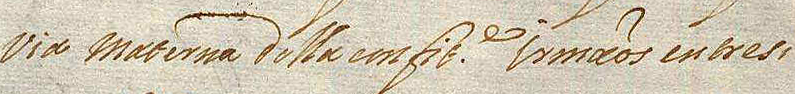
via materna della confit.e iImãos entre si
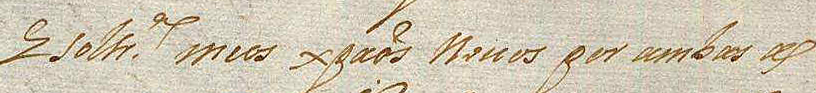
E soltr.os meos xpãos nouos por ambas as
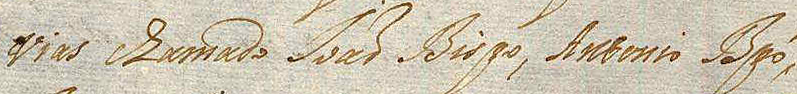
vias chamado Ioão Bispo, Antonio Bpo̅,
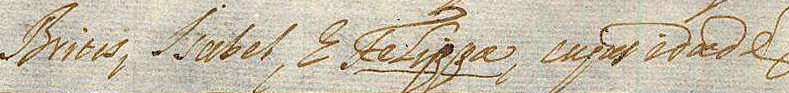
Brites, Isabel, E Felippa, cujas idades
